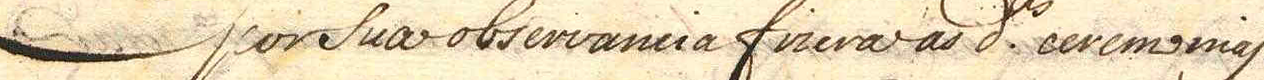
E por sua observancia fizera as d.as ceremonias
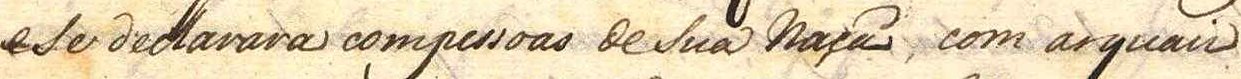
e se declarara com pessoas de sua nação, com as quais
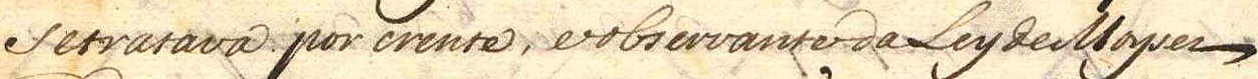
se tratava por crente, e observante da Ley de Moyses.
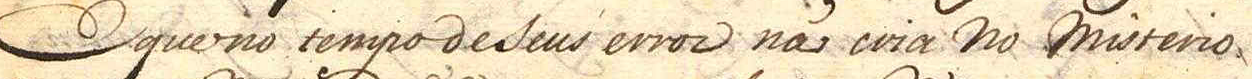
E que no tempo de seus erros não cria no misterio,
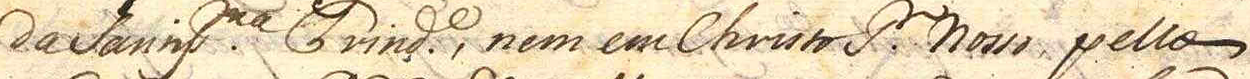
da santiss.ma Trind.e, nem em Christo s.r nosso pello
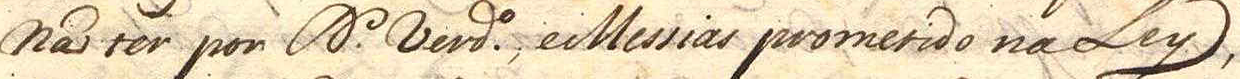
não ter por D.s Verd.o, e Messias, prometido na Ley,
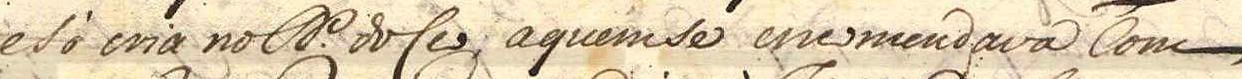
e só cria no D.s do Ceo, a quem se emcomendava com
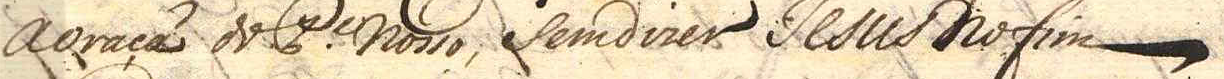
a oração do P.e nosso, sem dizer Iesus no fim.
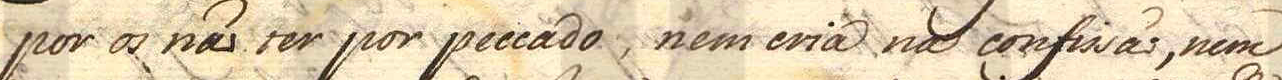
por os não ter por peccado, nem cria na confissão, nem
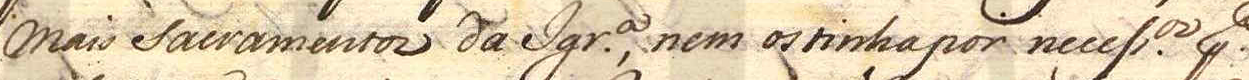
mais sacramentos da Igr.a, nem os tinha por necess.os p.a
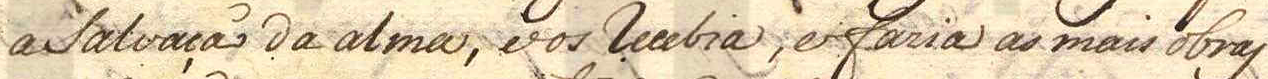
a salvaçaõ da alma, e os Recebia, e fazia as mais obras
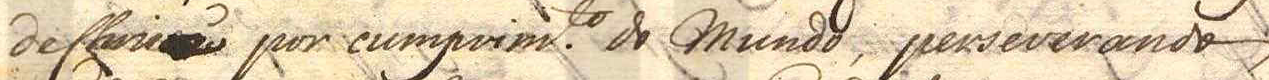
de Chris_õ por cumprim.to do mundo, perseverando
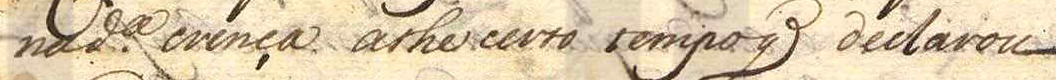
na d.a crença athe certo tempo q̄ declarou
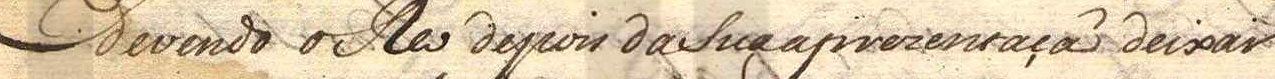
E devendo o Reo depois da sua aprezentaçaõ deixar
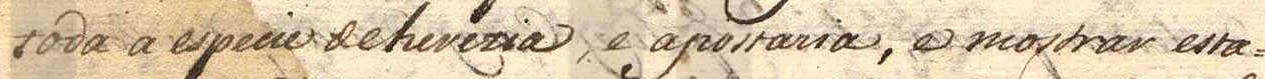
toda a especie de herezia, e apostazia, e mostrar esta
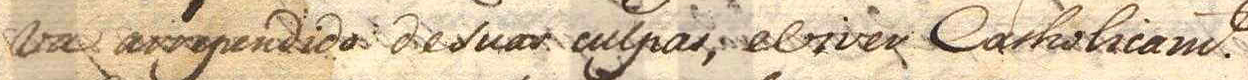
va arrependido de suas culpas, e viver Catholicam.te
